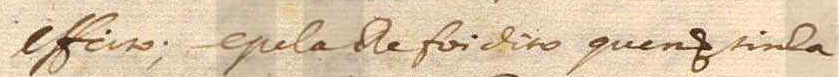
effeito; e pela Re foi dito que naõ tinha
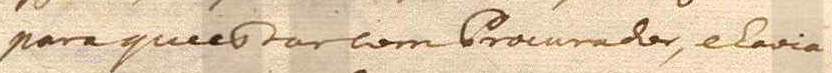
para que estar com Procurador, e havia
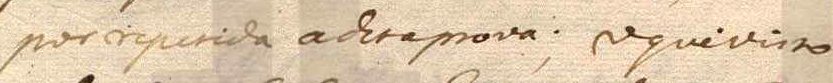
por repetida a dita prova: o que visto
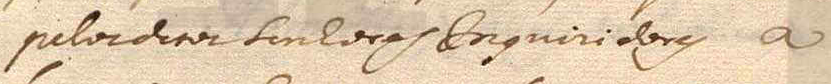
pelos ditos senhores Inquizidores a
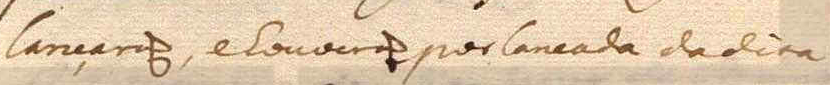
lançaraõ, e houveraõ por lancada da dita
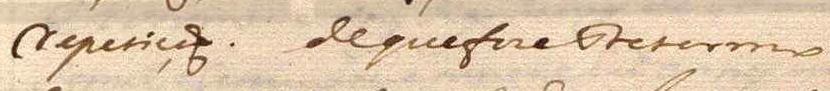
repetição. de que fiz este termo
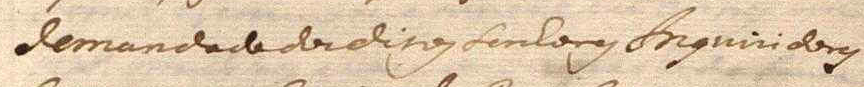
de mandado dos ditos senhores Inquizidores
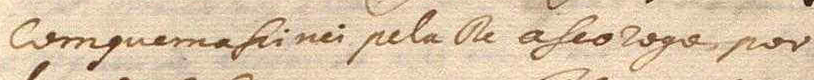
com quem assinei pela Re a seo Rogo por
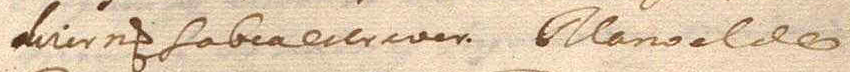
dizer nõ sabia escrever. Manoel de
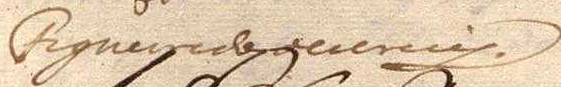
Figueiredo o ecreuy.
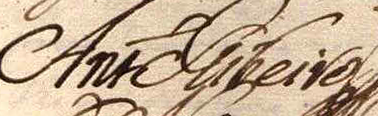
Anto Ribeiro
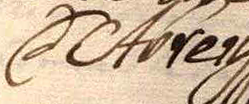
d̄ Abreu
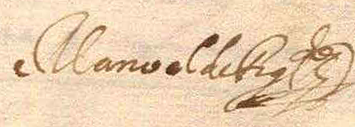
Manoel de Figdo
